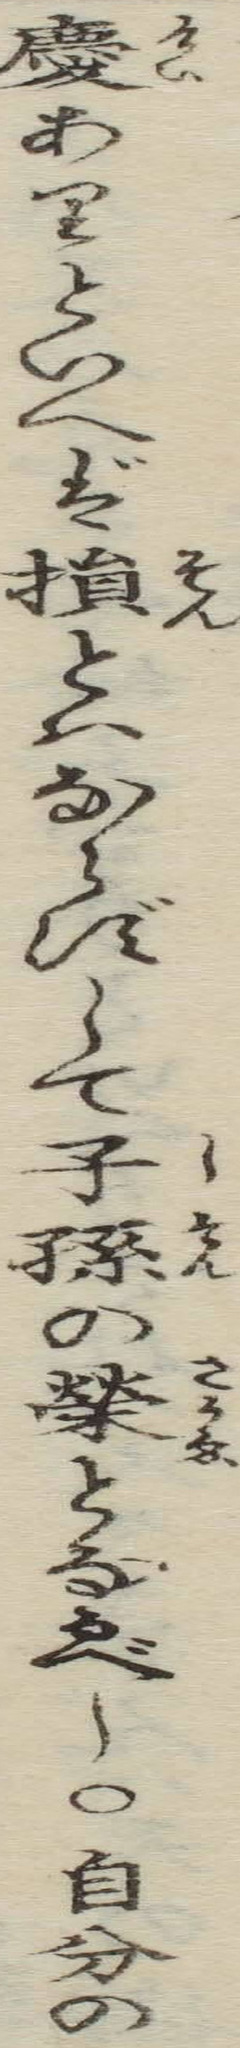慶ありといへば損とはならずして子孫の栄となるべし○自分の
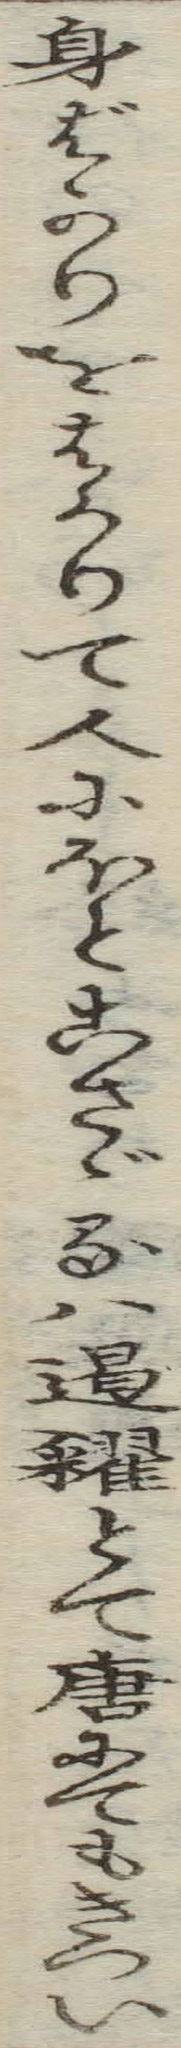身ばかりをはかりて人にほとこさゞるは遏糴とて唐にてもきつい
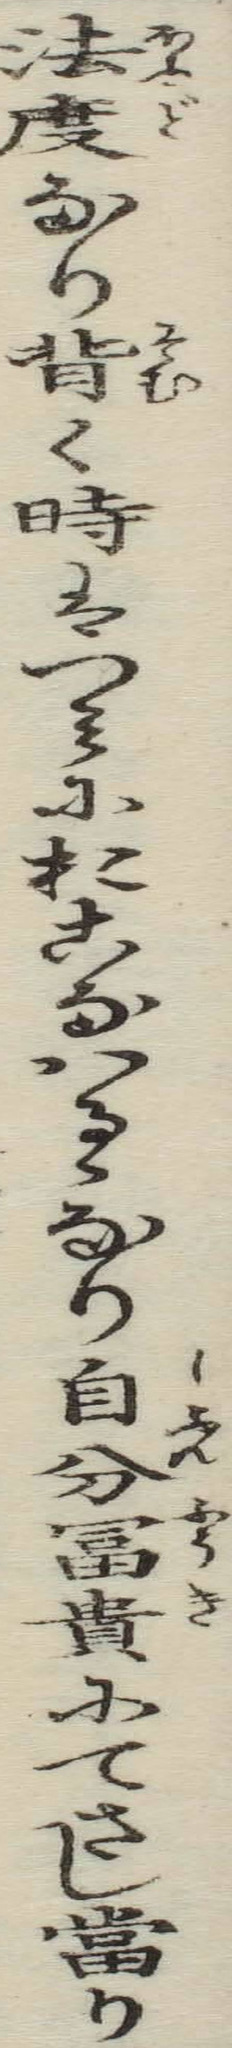法度なり背く時はつみにおこなはるゝなり自分富貴にてさし当り
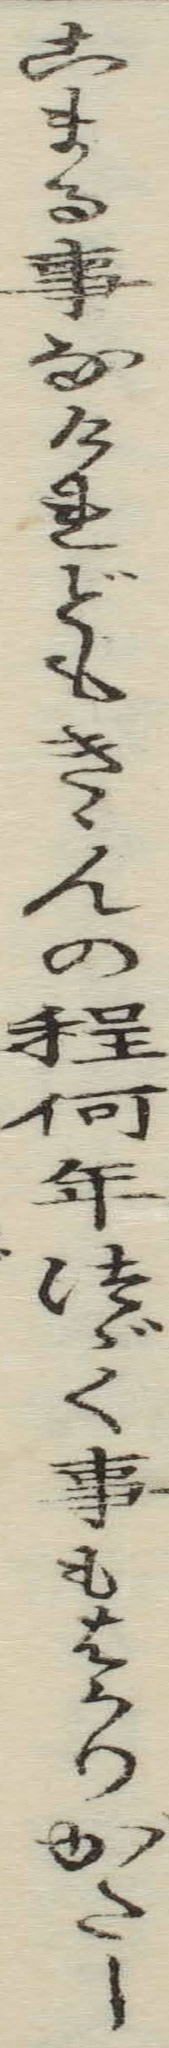こまる事なけれどもきゝんの程何年つゞく事もはかりがたし
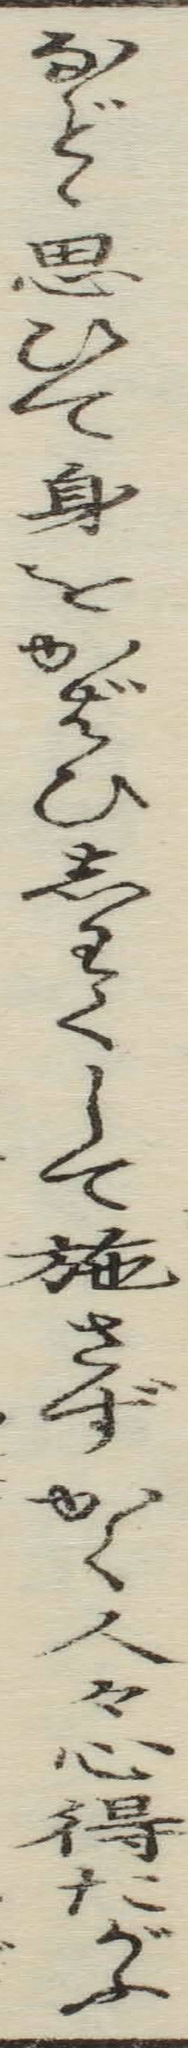などゝ思ひて身をかばひしわくして施さずかく人々心得たがふ
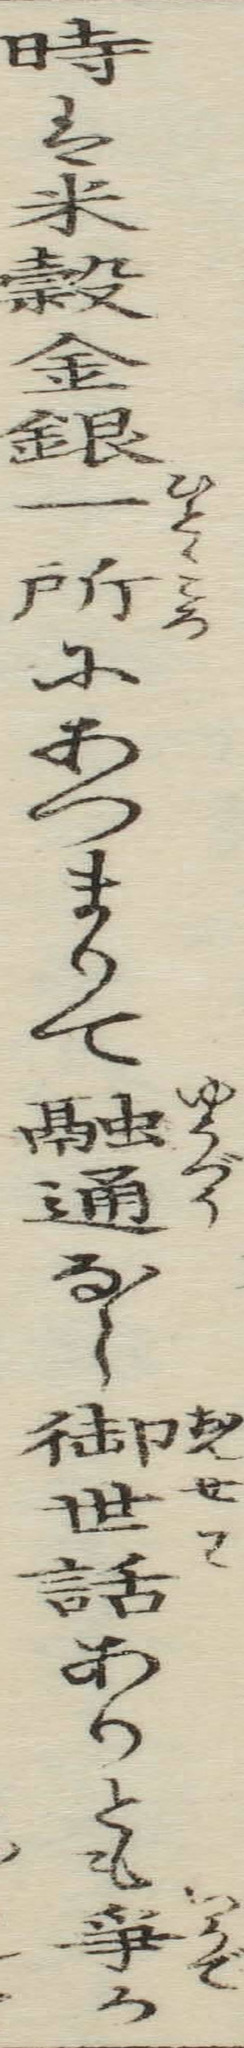時は米穀金銀一所にあつまりて融通なし御世話ありとも争か
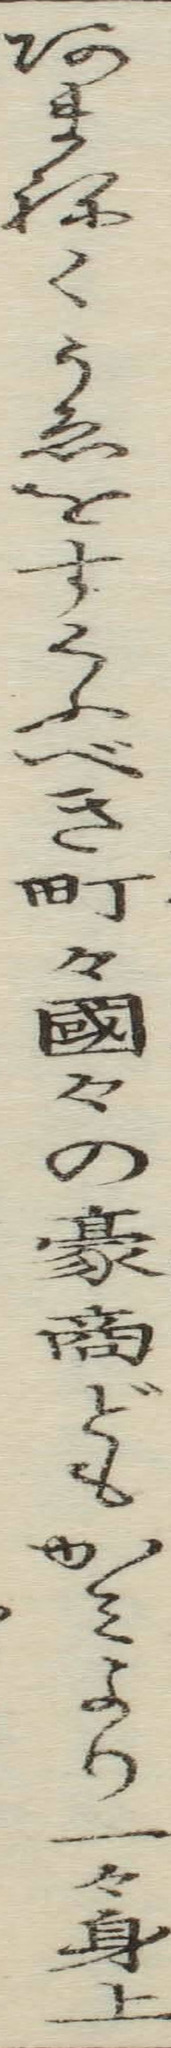あまねくうゑをすくふべき町々国々の豪商どもかみより一々身上
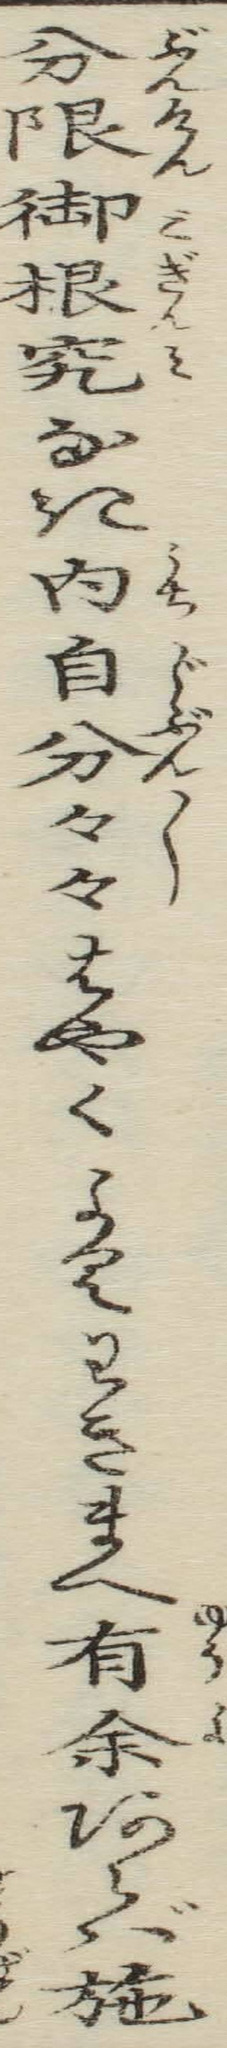分限御根究なき内自分々々はやくよくわきまへ有余あらば施
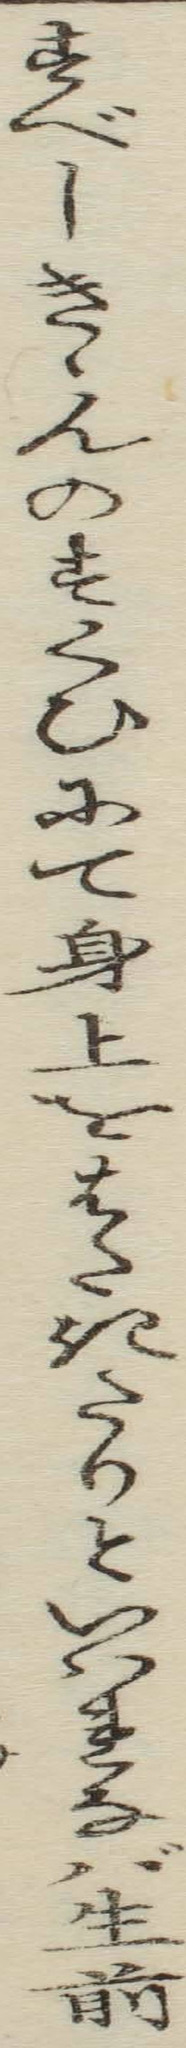すべしきゝんのすくひにて身上をはたきたりといはれなば生前
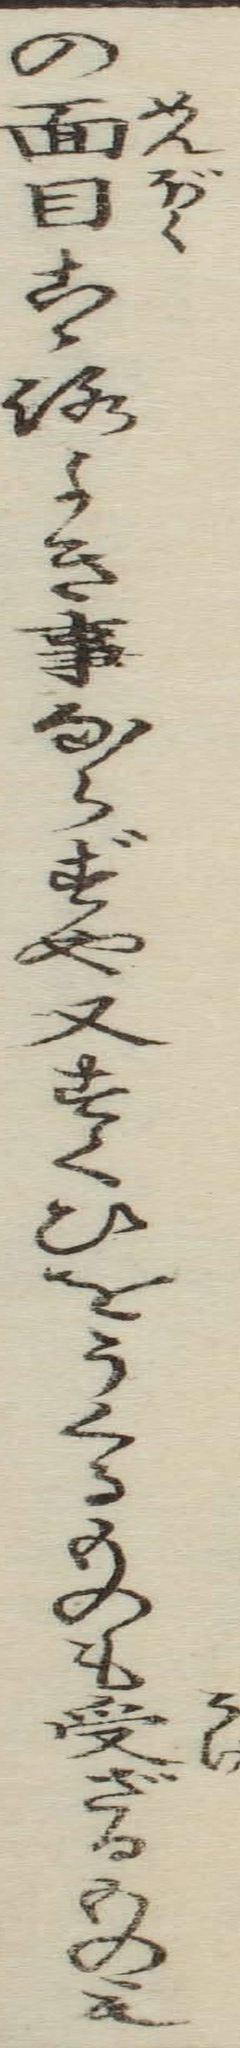の面目こゝろよき事ならずや又すくひをうくるものも受ざるものも

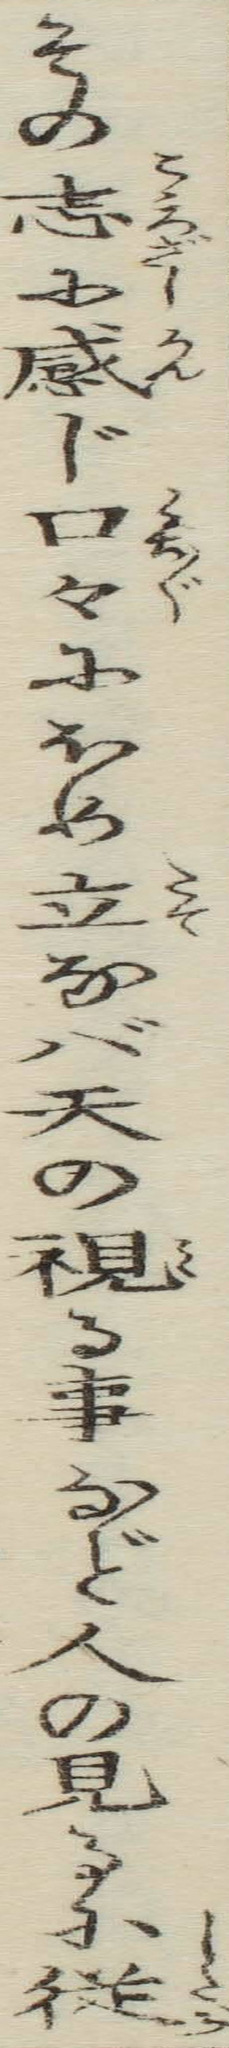その志に感じ口々にほめ立なば天の視る事など人の見るに従
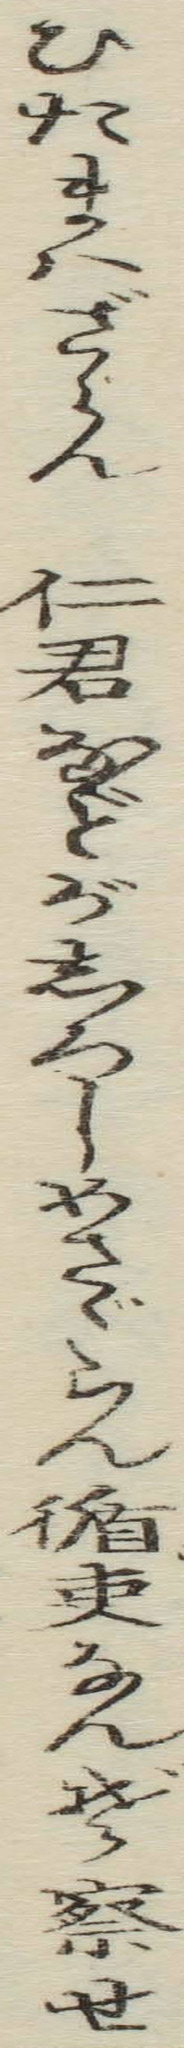ひたまはざらん仁君などがしろしめさゞらん循吏なんぞ察せ
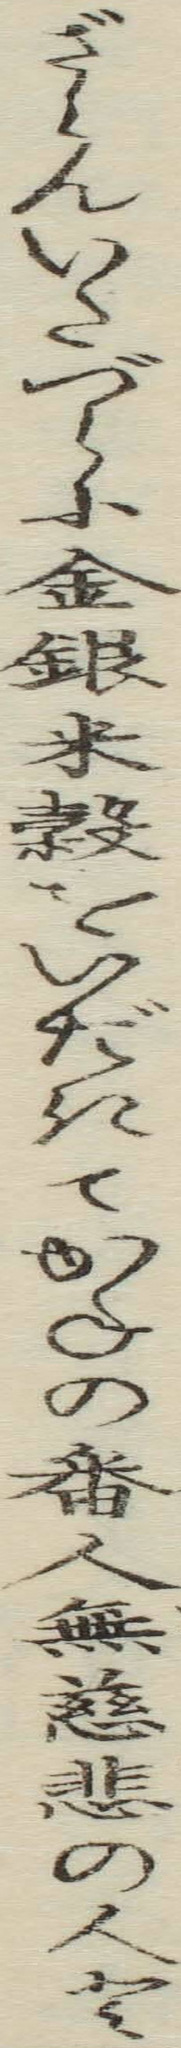ざらんいたづらに金銀米穀をいだきてかねの番人無慈悲の人と
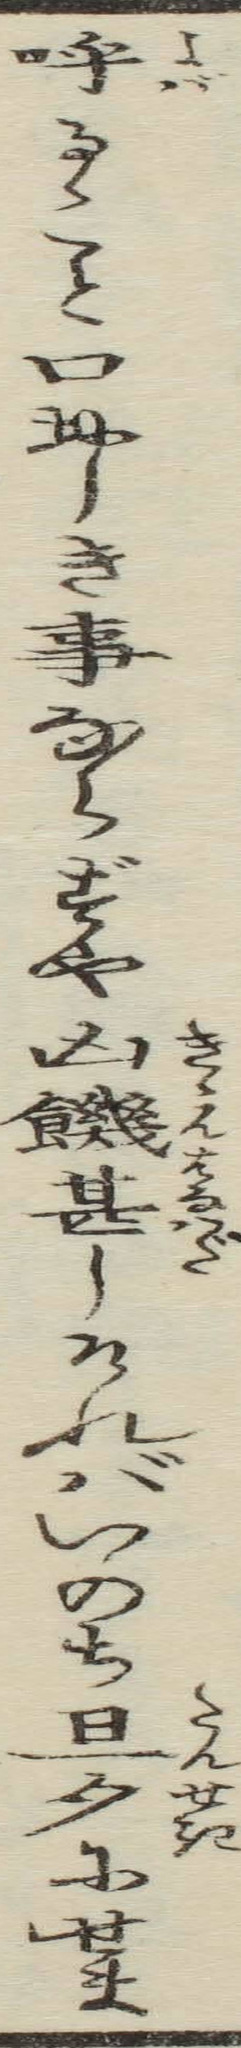呼るゝこと口おしき事ならずや凶饑甚しければいのち旦夕にせま
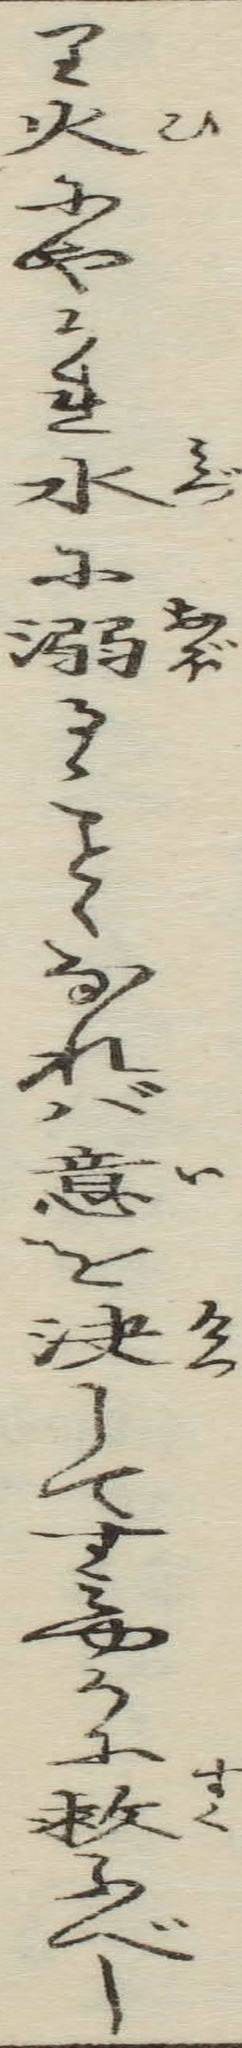り火にやかれ水に溺るゝことくなれば意を決してすみやかに救ふべし
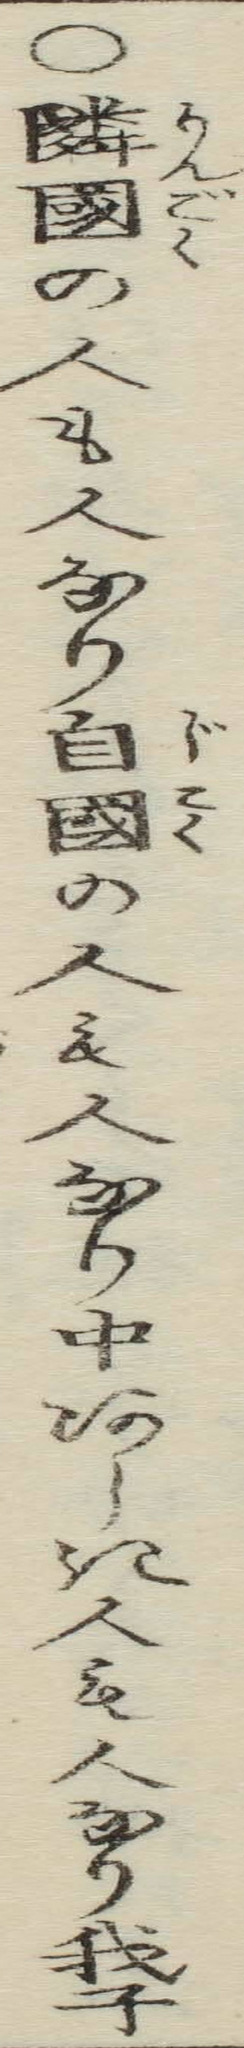○隣国の人も人なり自国の人も人なり中あしき人も人なり我子
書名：救荒便覧
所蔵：国文学研究資料館
